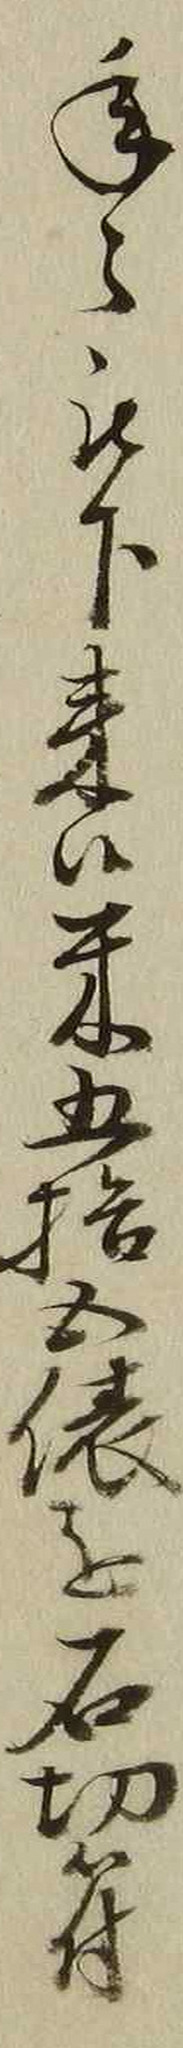年々被下来候米五拾五俵を石切符
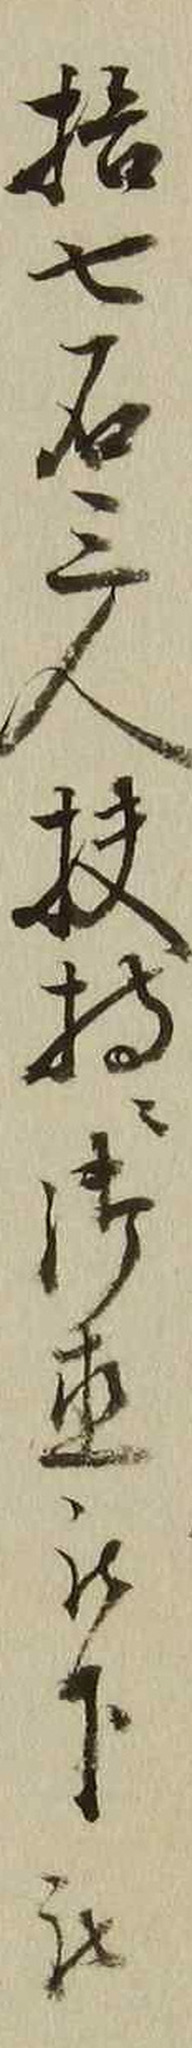拾七石三人扶持御直被下被
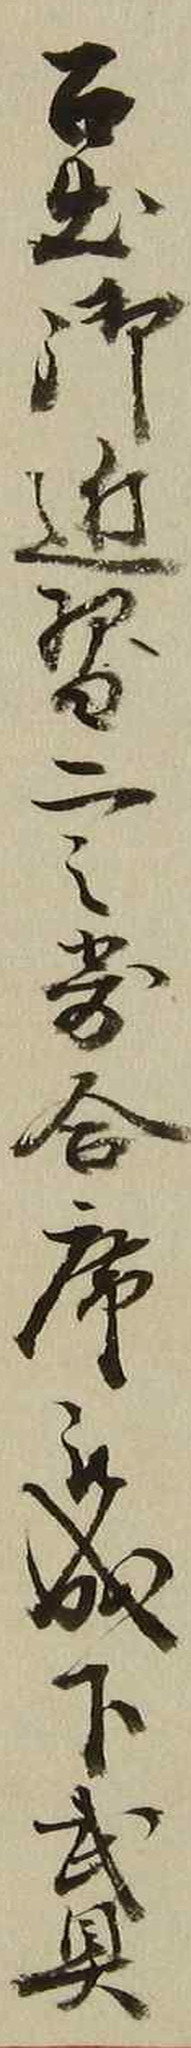召出御近習二之寄合席被成下武具
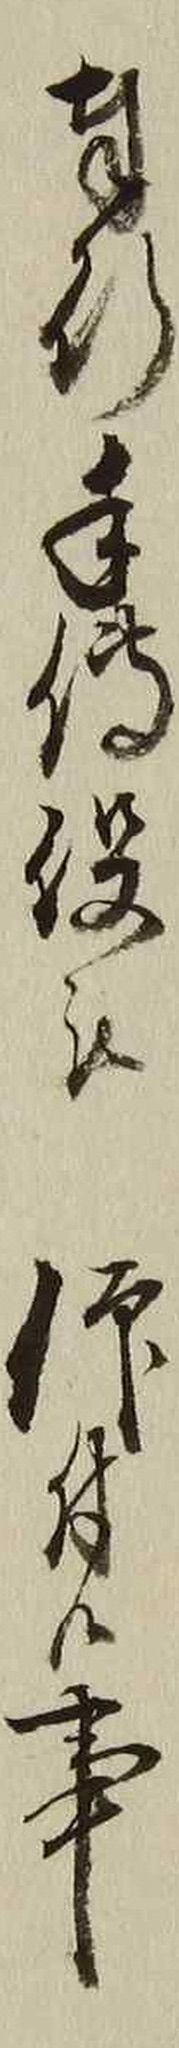奉行手伝役被仰付候事
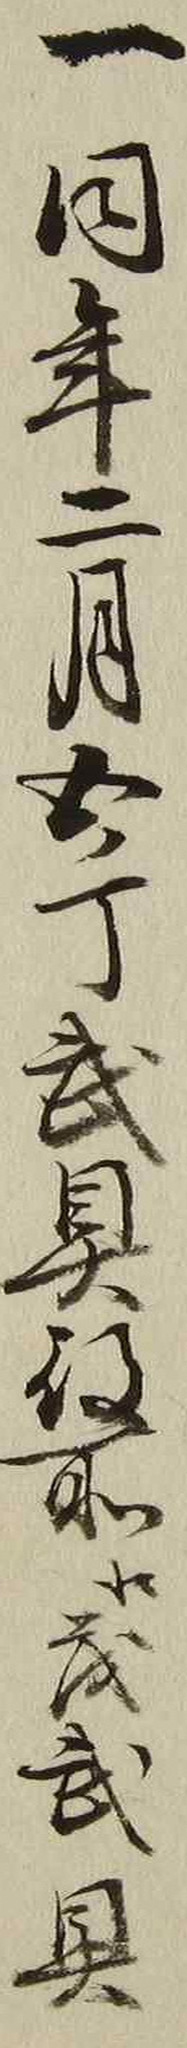一同年二月五ノ丁武具役所江茂武具
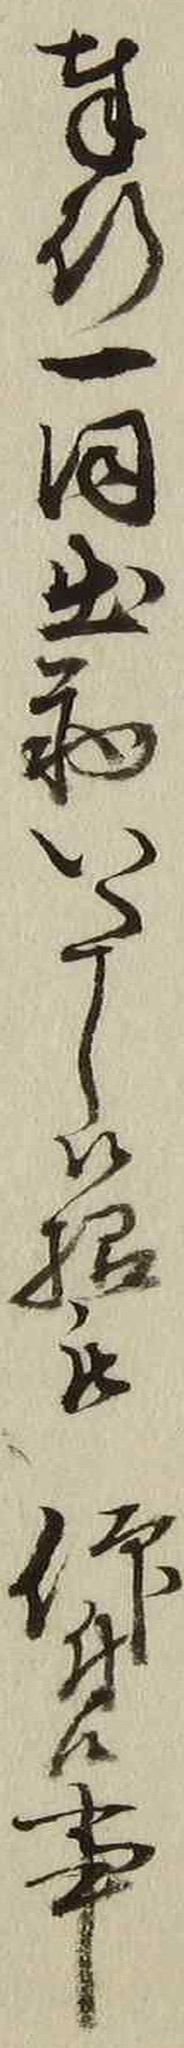奉行一同出勤いたし候様被仰付候事
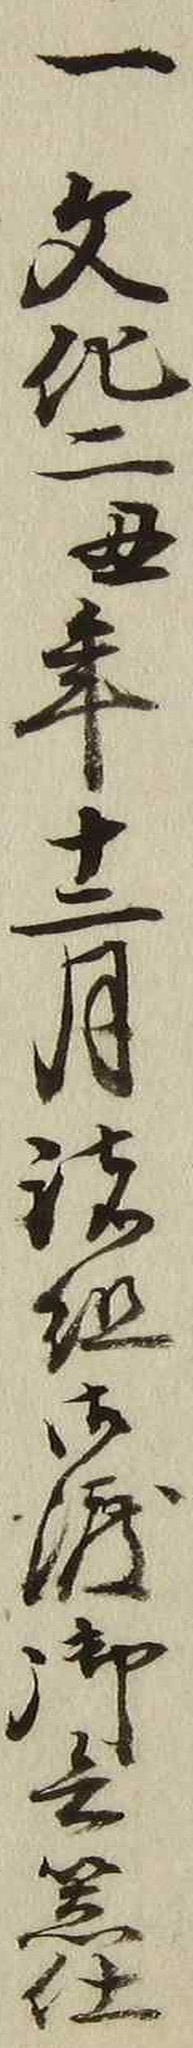一文化二丑年十二月諸組御渡御兵器仕
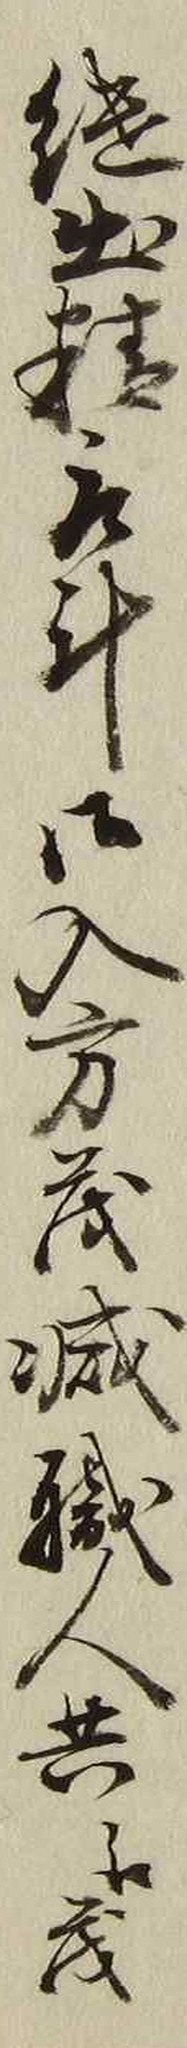継出精取計御入方茂減職人共江茂
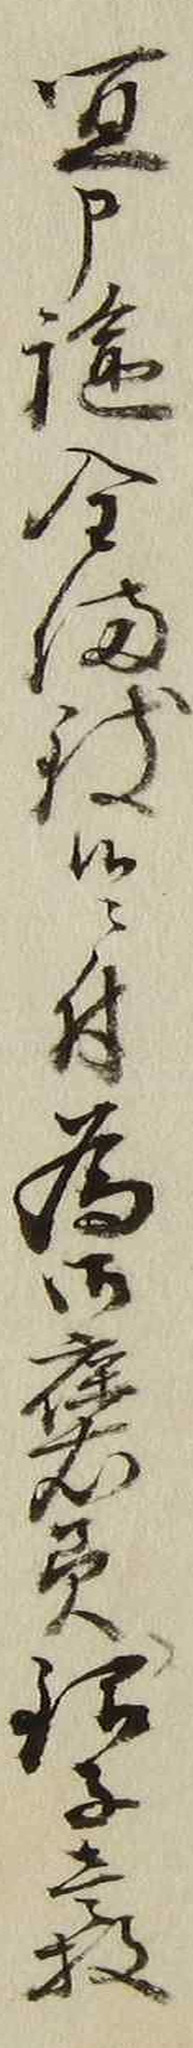宜申諭全備致候ニ付為御褒美銀子壱枚
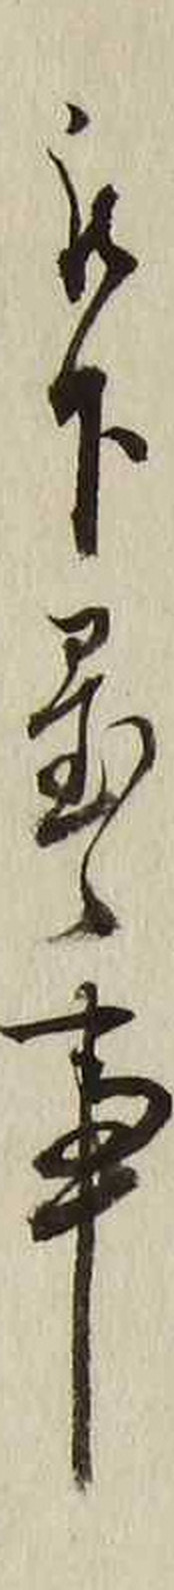被下置候事
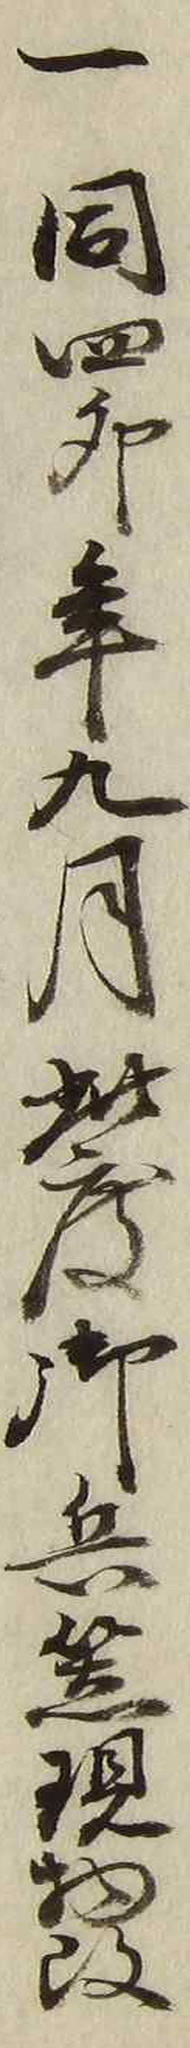一同四卯年九月此度御兵器現物改
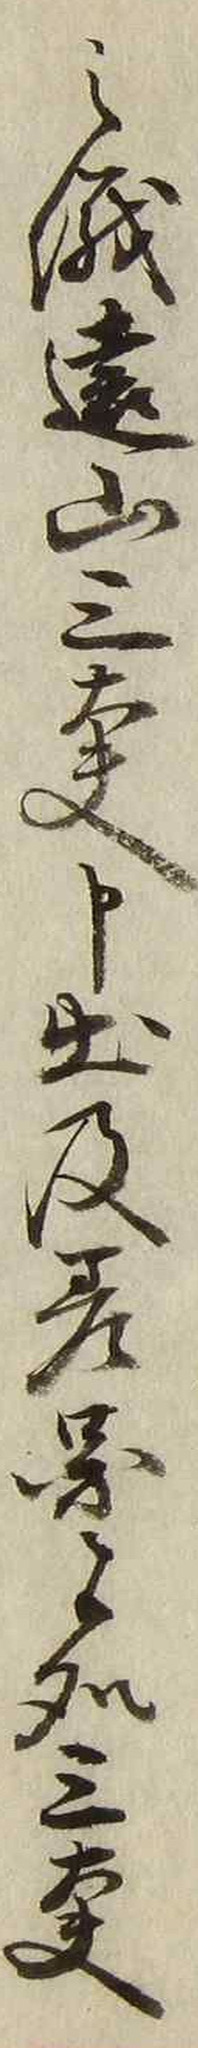之涙遠山三大夫申出及差図ニ候処三大夫
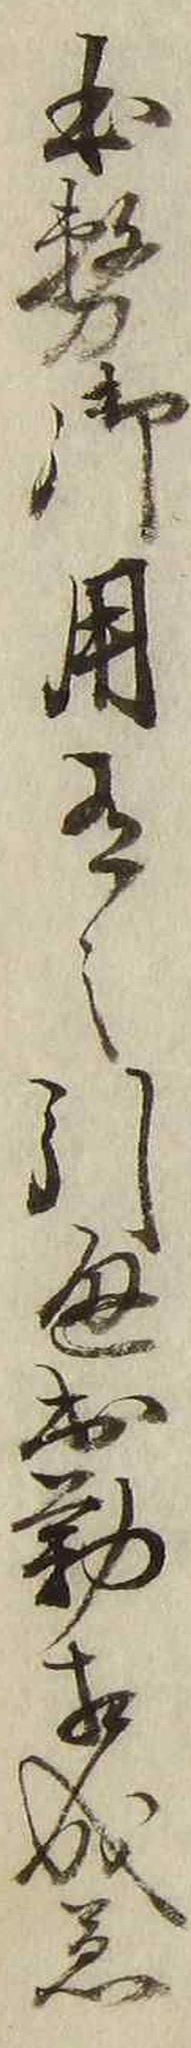本務御用有之引通出勤相成兼

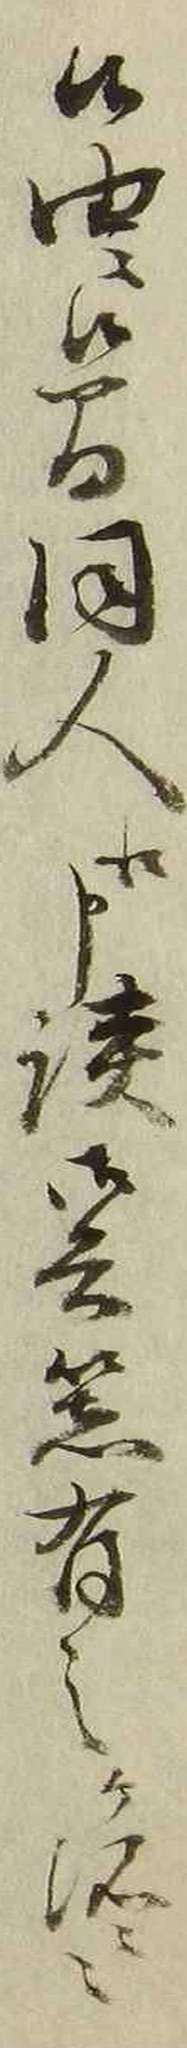候由ニ候間同人江申談御兵器有之ヶ所々々
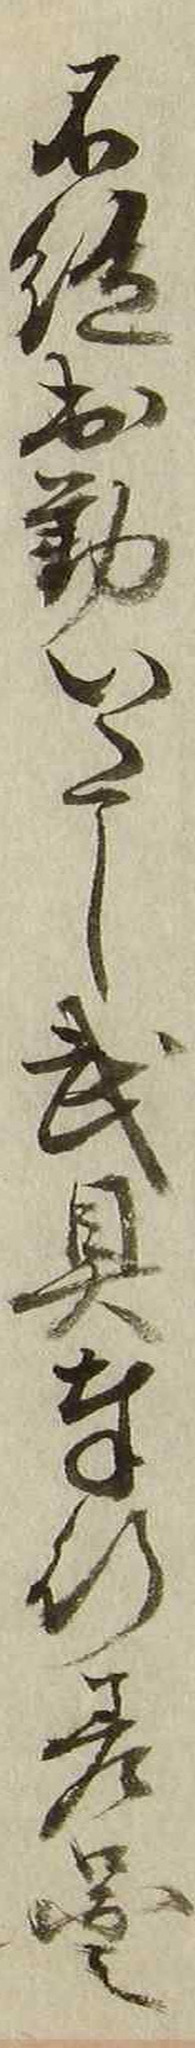不絶出勤いたし武具奉行差図之
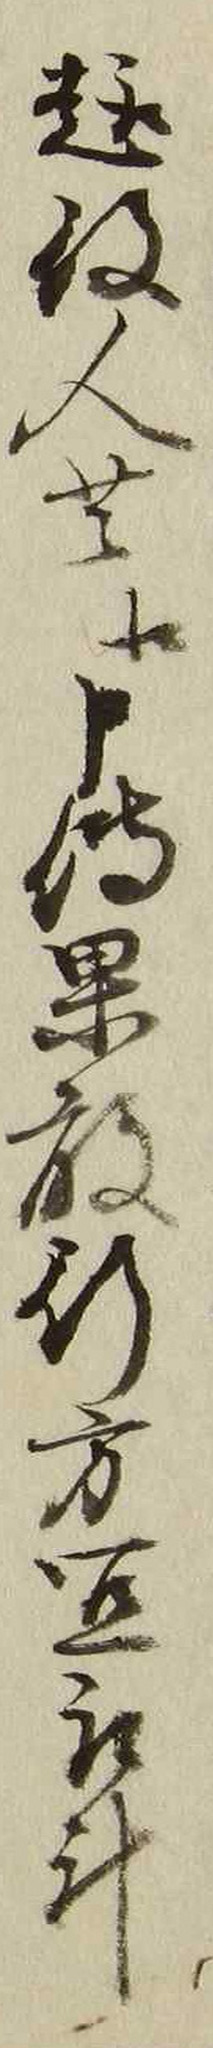趣役人共江申伝果敢行方宜取計
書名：諸士系譜　巻之36　は之部4
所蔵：会津若松市立会津図書館
